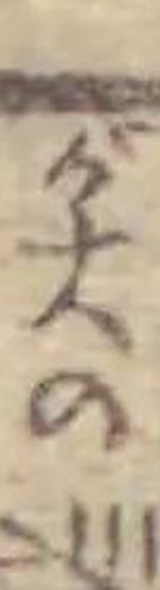が大の
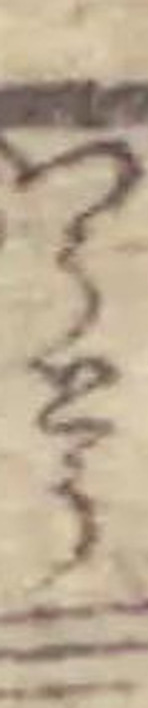つうとう
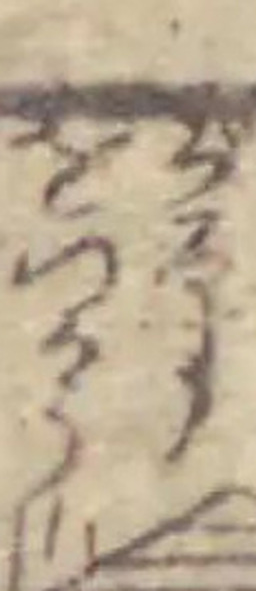をつかう
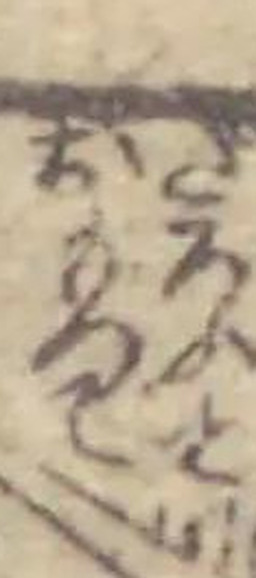おもつて
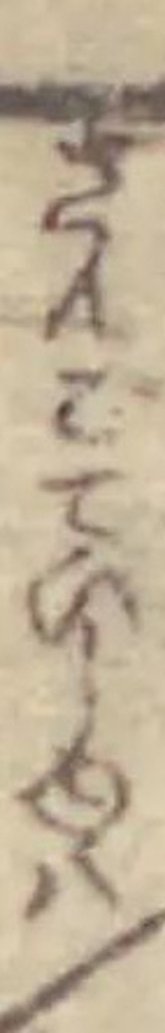さんごていしゆは
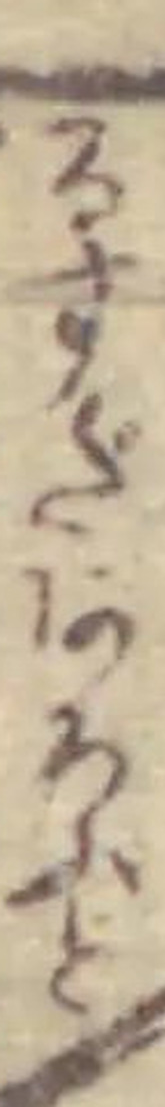るすだあろふと
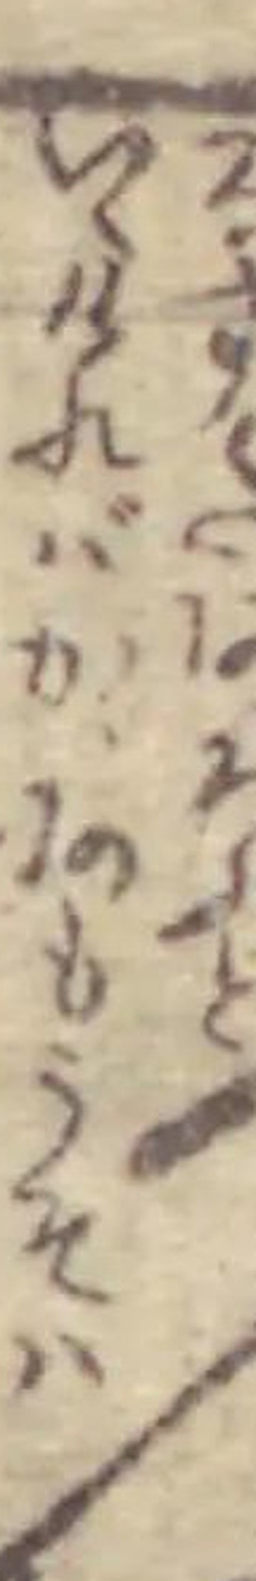いゝければかゝあもうそは
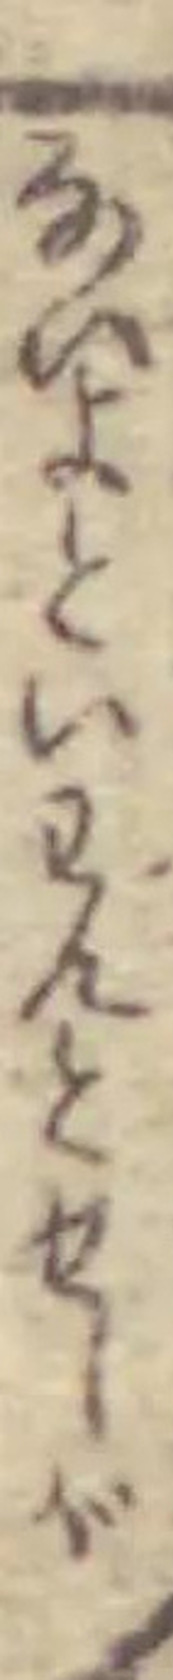ないよといわんとせしが
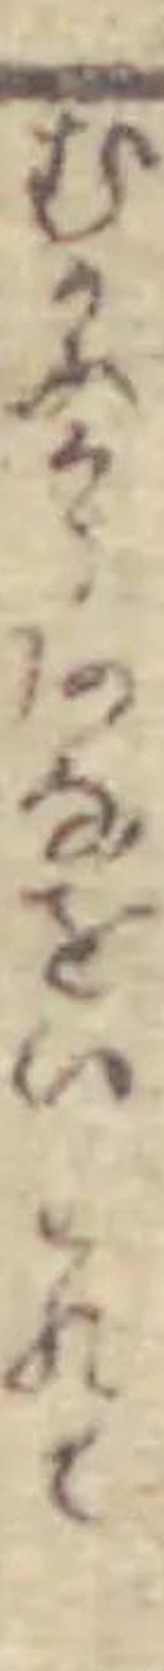むかふからあなをいれて
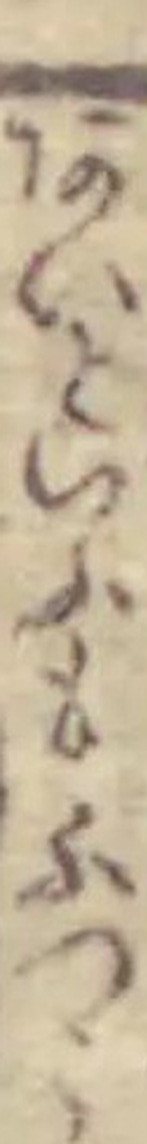あいといふもふつう
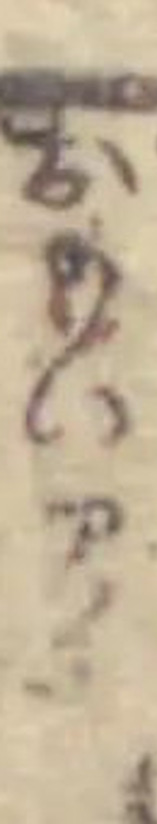おもいアイ
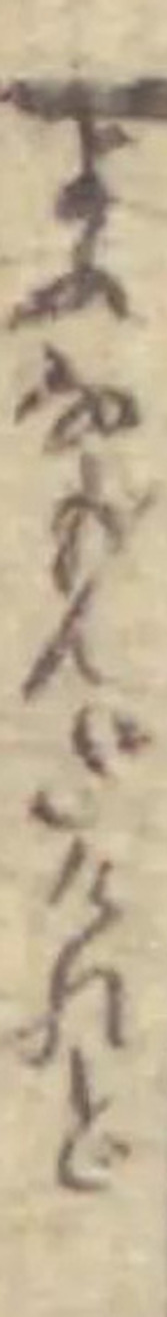よふなもんだけれど
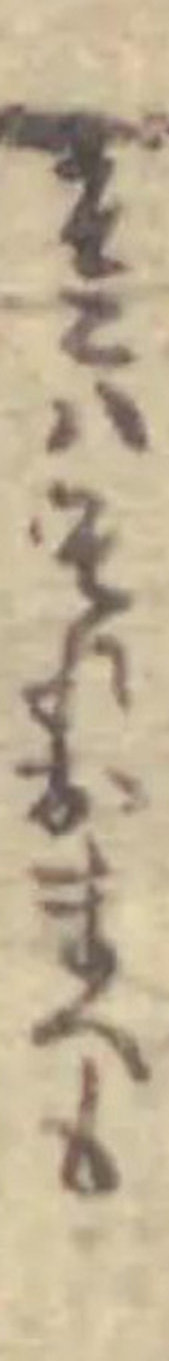そこはそれおまへも
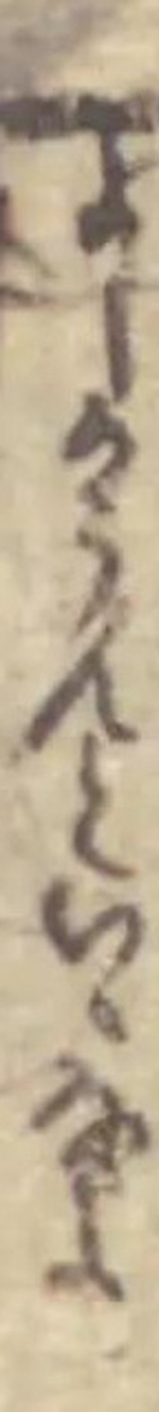よしかうんといゝなよ
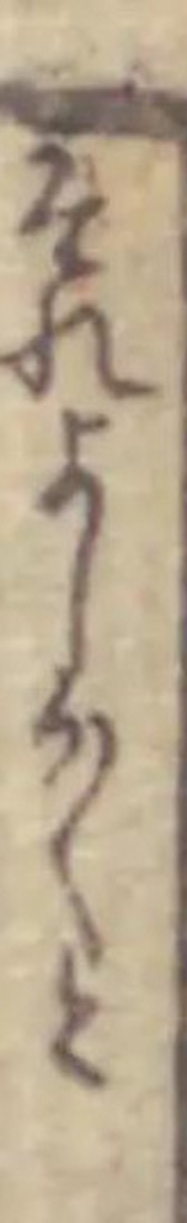それよしか〳〵と
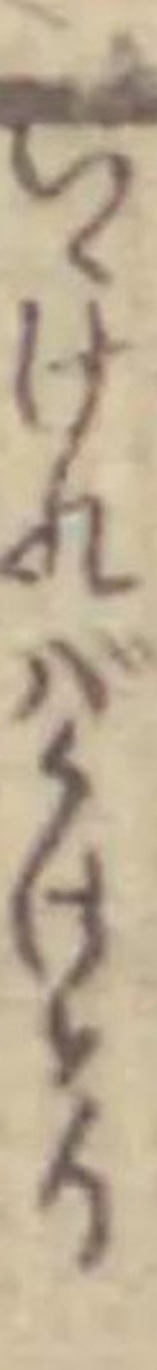いゝければかけとり
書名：茶羅毛通人 3巻
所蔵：国立国会図書館 National Diet Library, JAPAN
